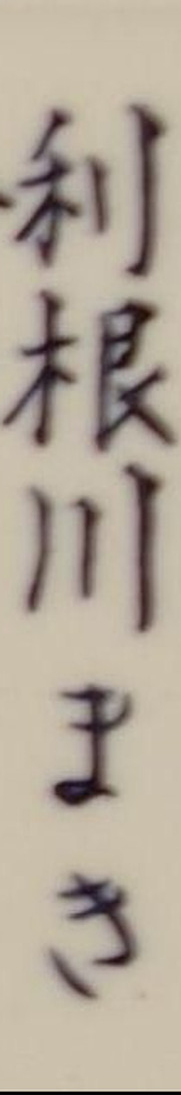利根川まき
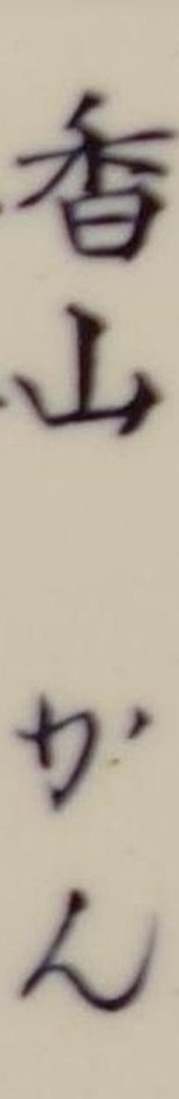香山かん
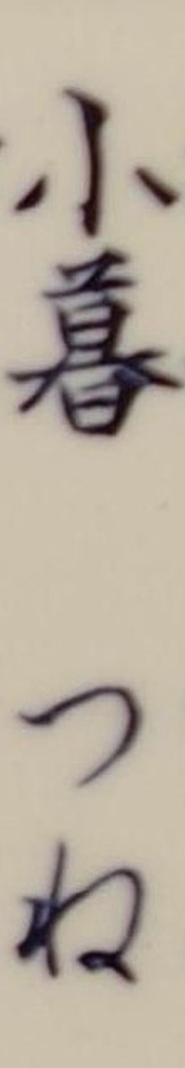小暮つね
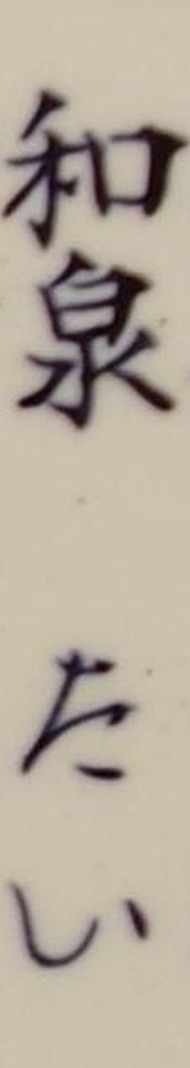和泉たい
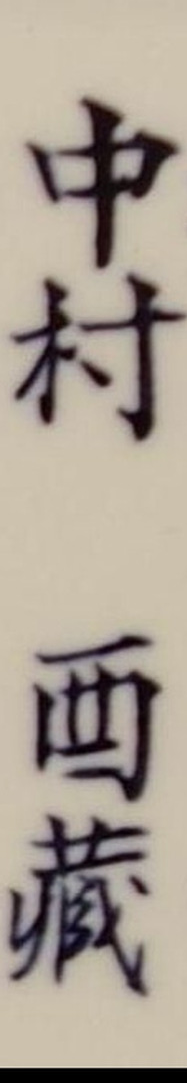中村酉蔵
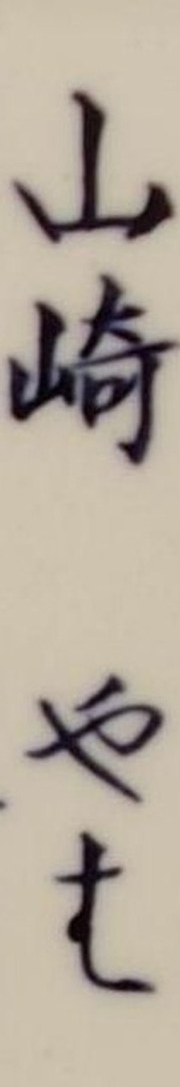山崎やは
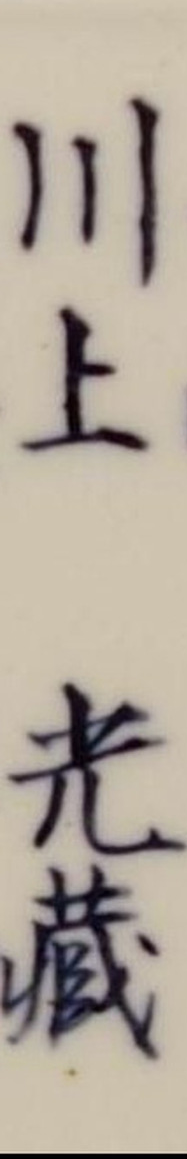川上光藏
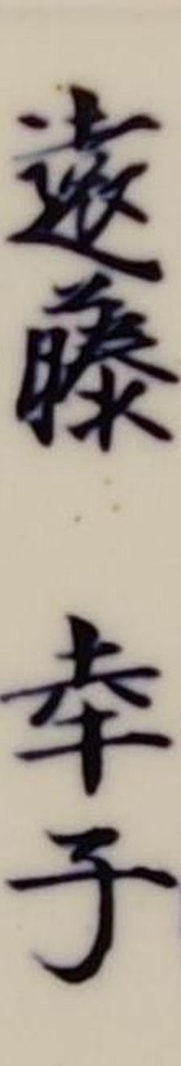遠藤幸子
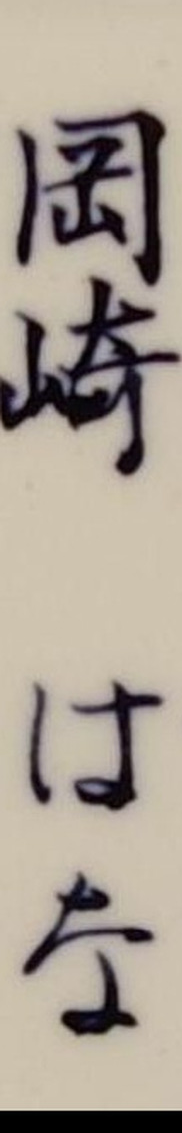岡崎はな
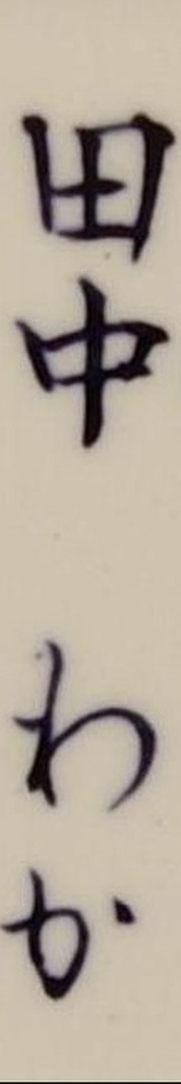田中わか
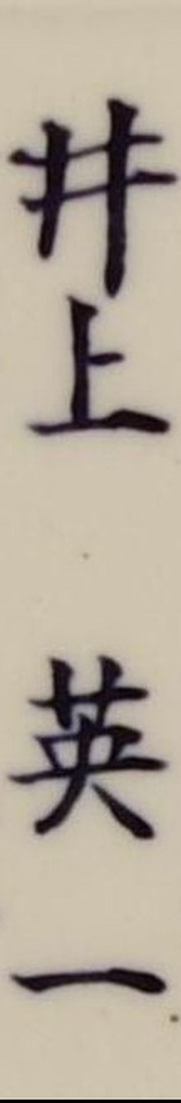井上英一
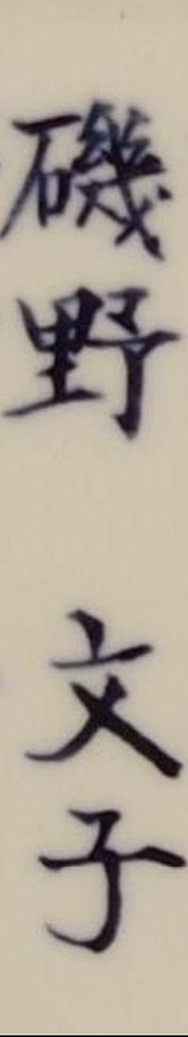磯野文子
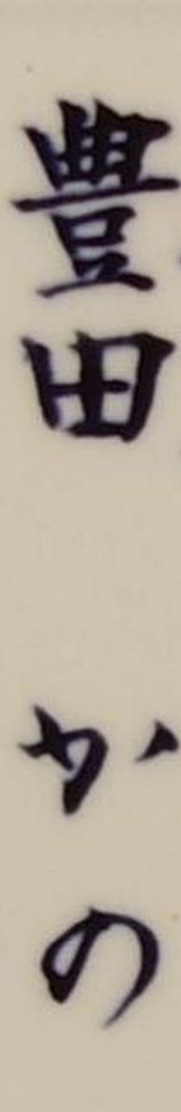豊田かの
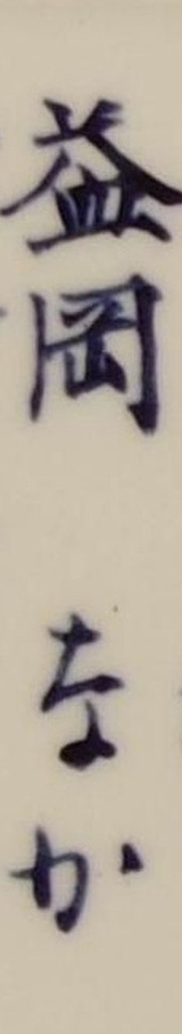益岡なか
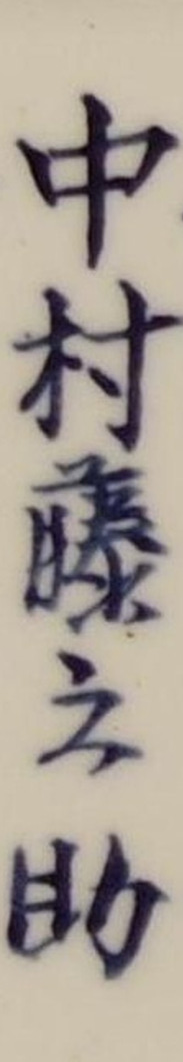中村藤之助
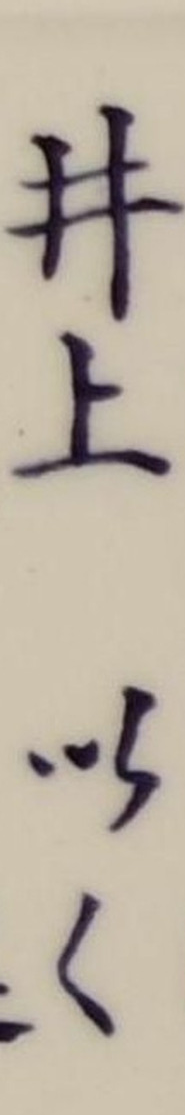井上いく
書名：M~S
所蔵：高野山金剛峯寺
